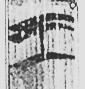王
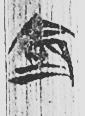命
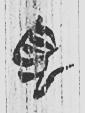見
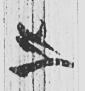之
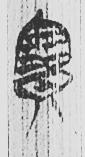賽
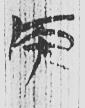侯
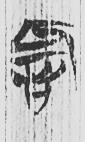怠
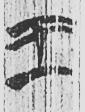王
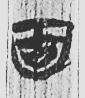固
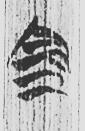命
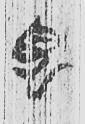見
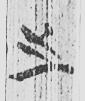之
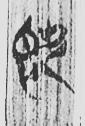既
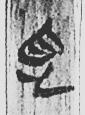見
